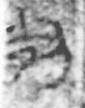削
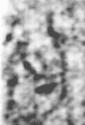紫
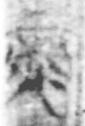彔（綠）
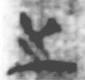之
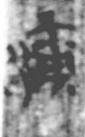鞅
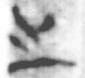之
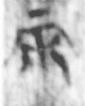兩
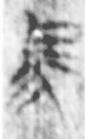馬
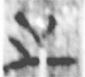之
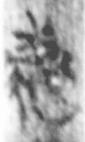○（轡）
